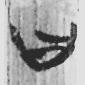曰
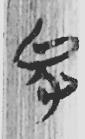允
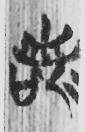若
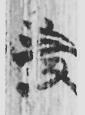寺
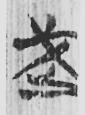武
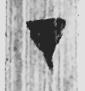丁
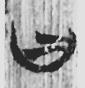曰
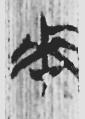來
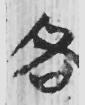各
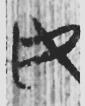女
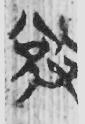敓（說）
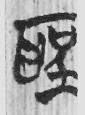聖
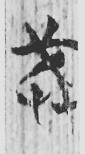戒
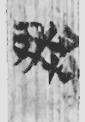朕
